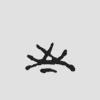至
